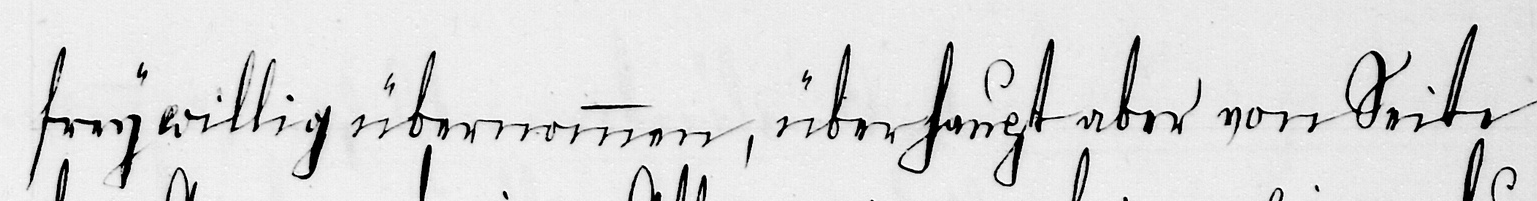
freywillig übernommen, überhaupt aber von Seite
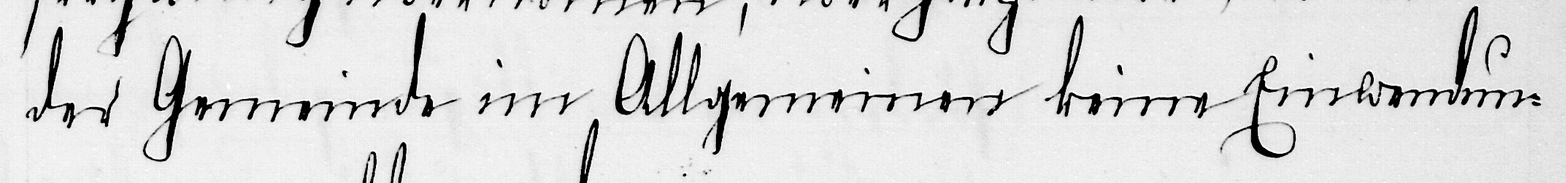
der Gemeinde im Allgemeinen keine Einwendun¬
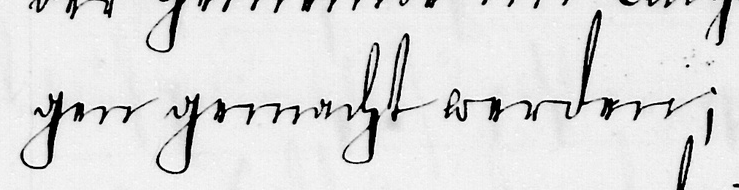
gen gemacht werden;
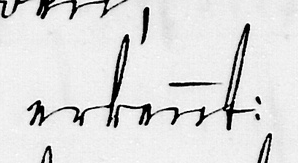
erkennt:
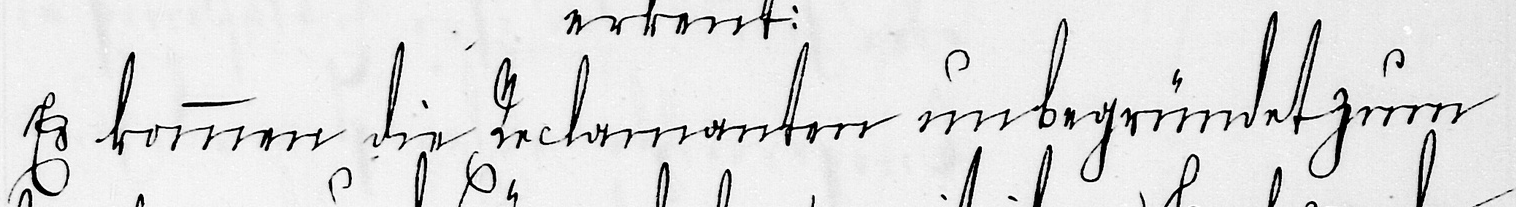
Es kommen die Reclamanten unbegründet zum
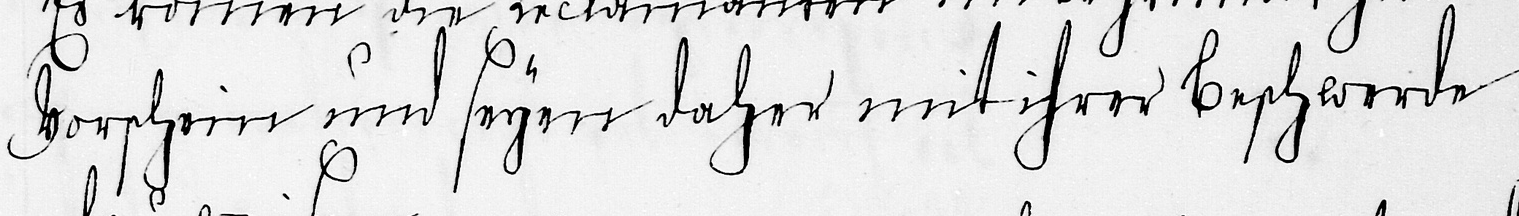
Vorschein und seyen daher mit ihrer Beschwerde
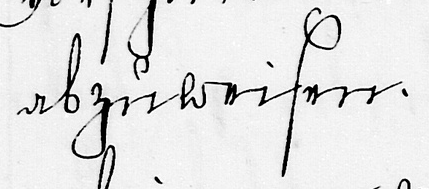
abzuweisen.
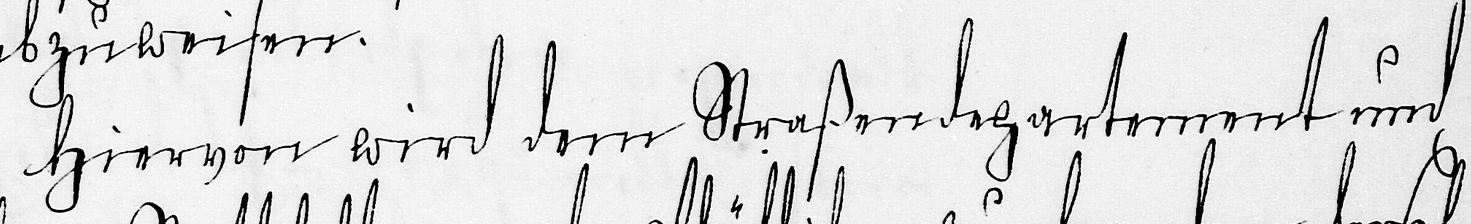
Hiervon wird dem Straßendepartement und
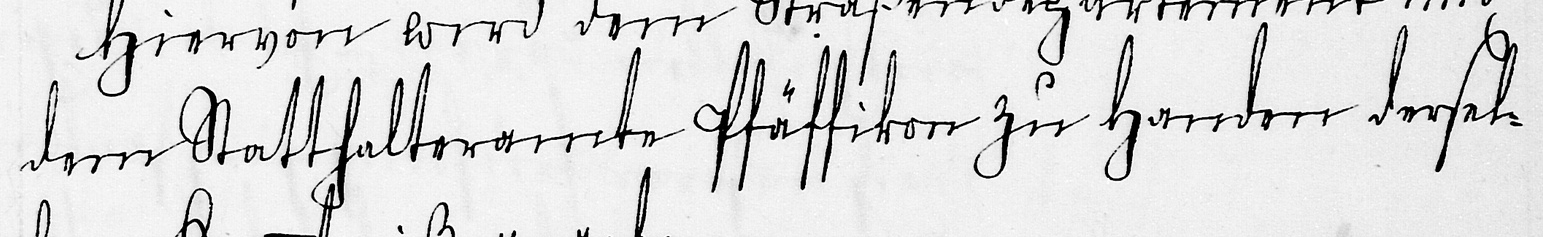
dem Statthalteramte Pfäffikon zu Handen dersel¬
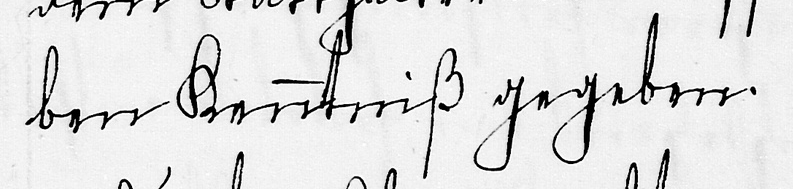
ben Kenntniß gegeben.
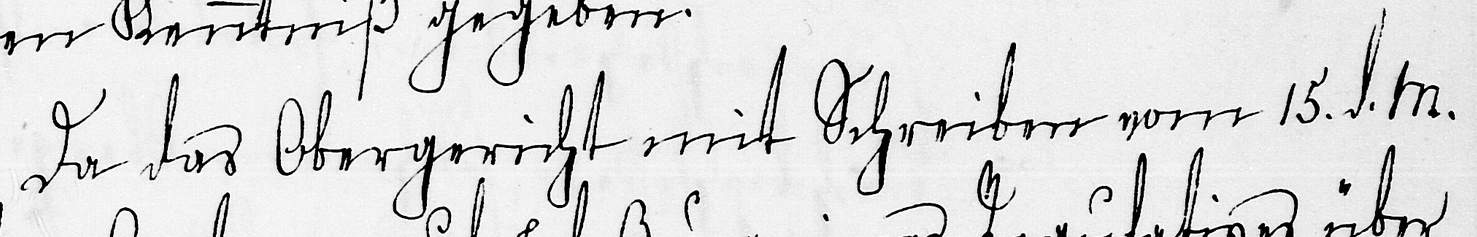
Da das Obergericht mit Schreiben vom 15. d. M.
